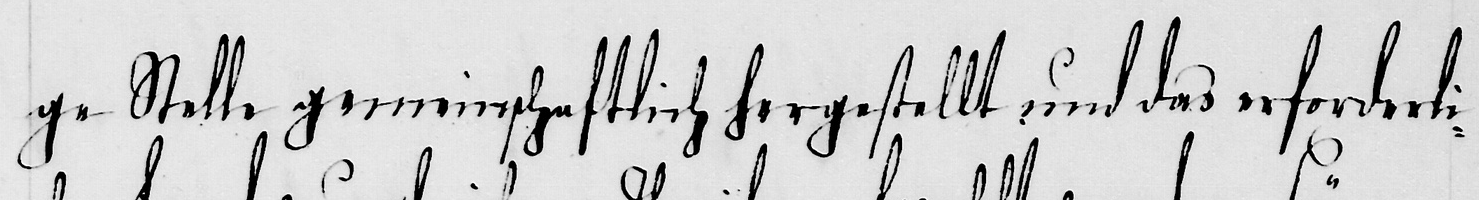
ge Stelle gemeinschaftlich hergestellt und das erforderl¬
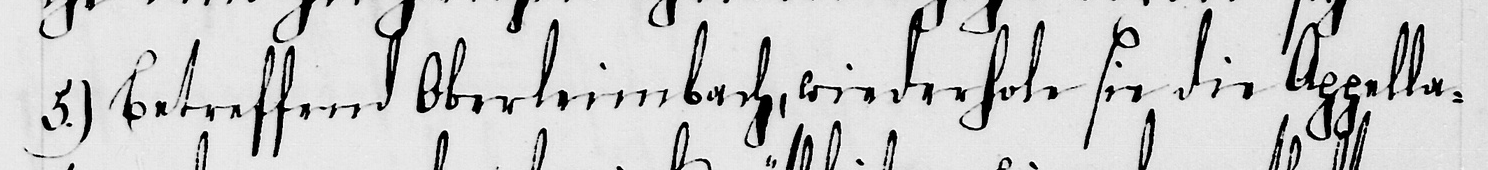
5.) Betreffend Oberleimbach, wiederhole sie die Appell¬
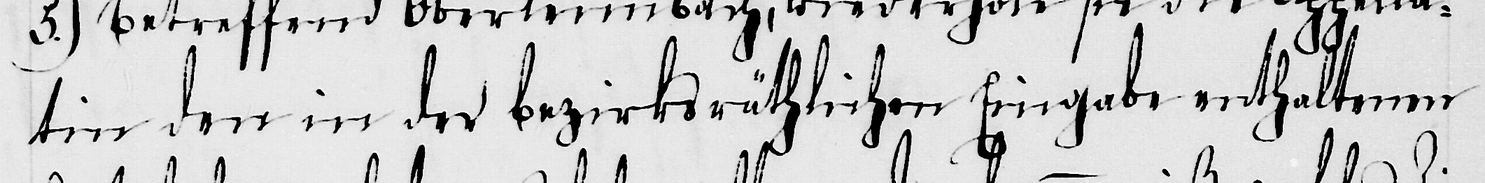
atin den in der bezirksräthlichen Eingabe enthaltenen
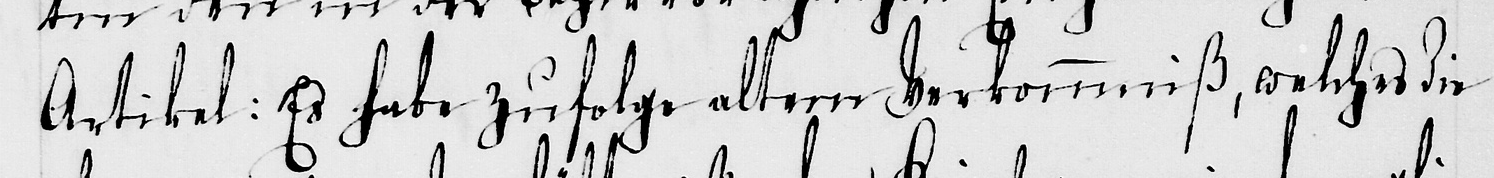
Artikel: Es habe zufolge altem Verkommniß, welches die
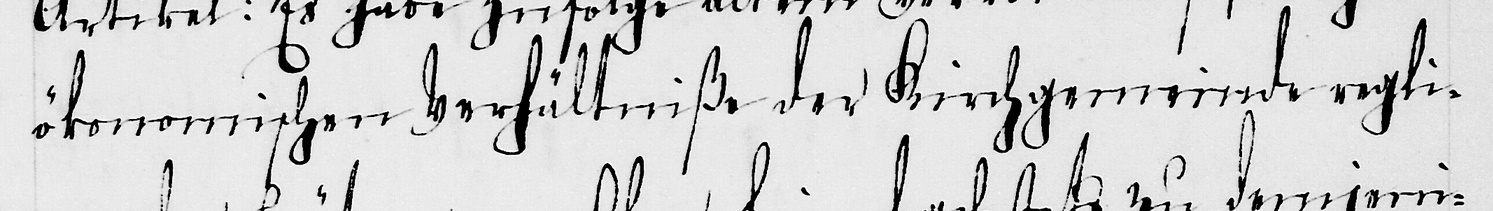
ökonomischen Verhältniße der Kirchgemeinde regli¬
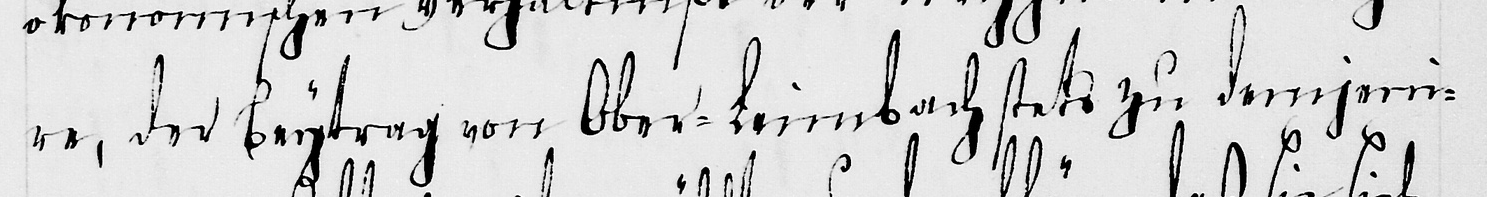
re, der Beytrag von Ober-Leimbach stets zu demjeni¬
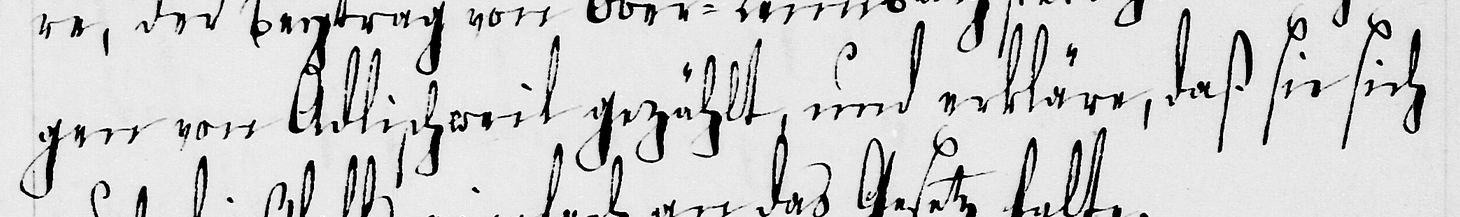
gen von Adlischweil gezählt, und erkläre, daß sie sich
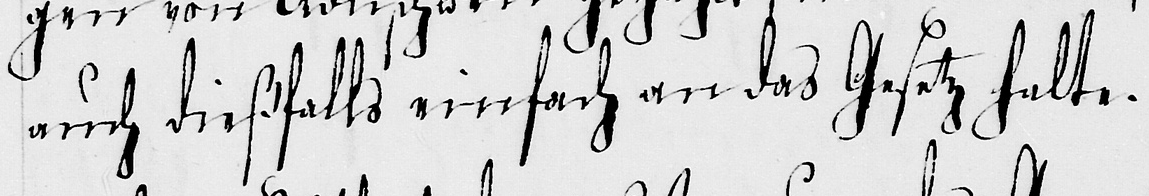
auch dießfalls einfach an das Gesetz halte.
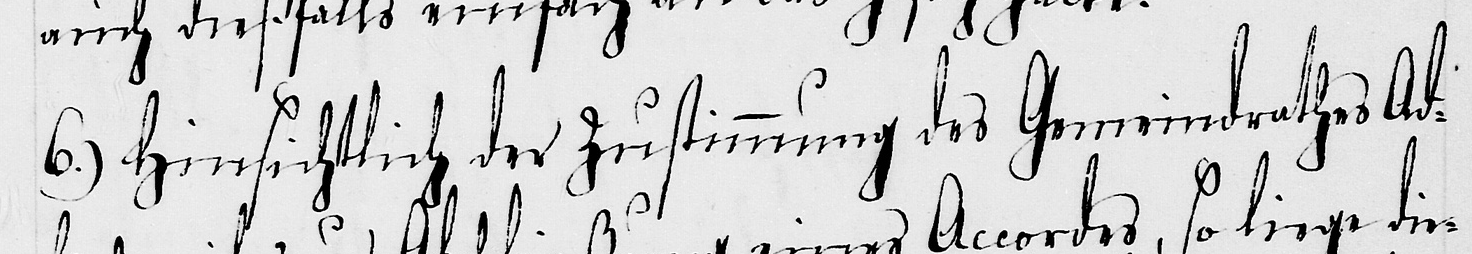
6.) Hinsichtlich der Zustimmung des Gemeindrathes Ad¬
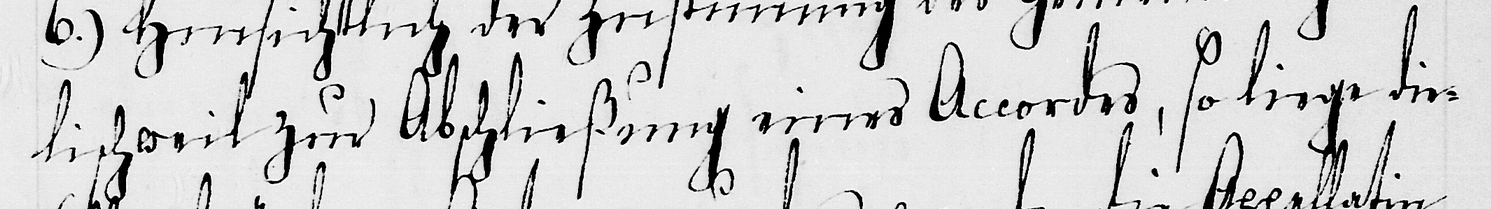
lischweil zur Abschließung eines Accordes, so liege die¬
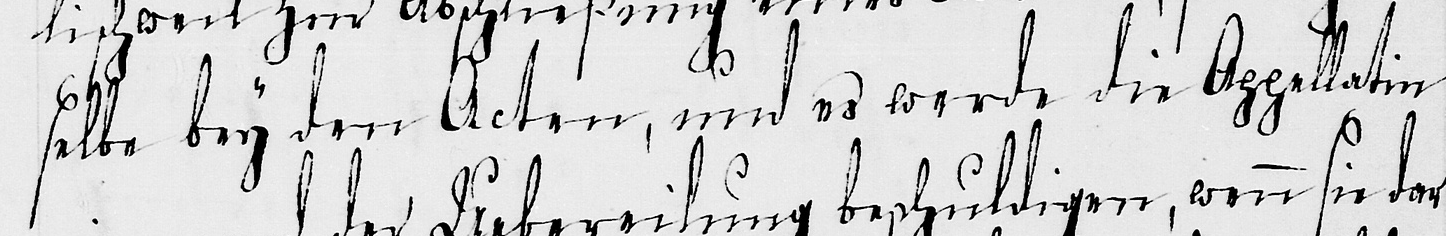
selbe bey den Acten, und es werde die Appellatin
